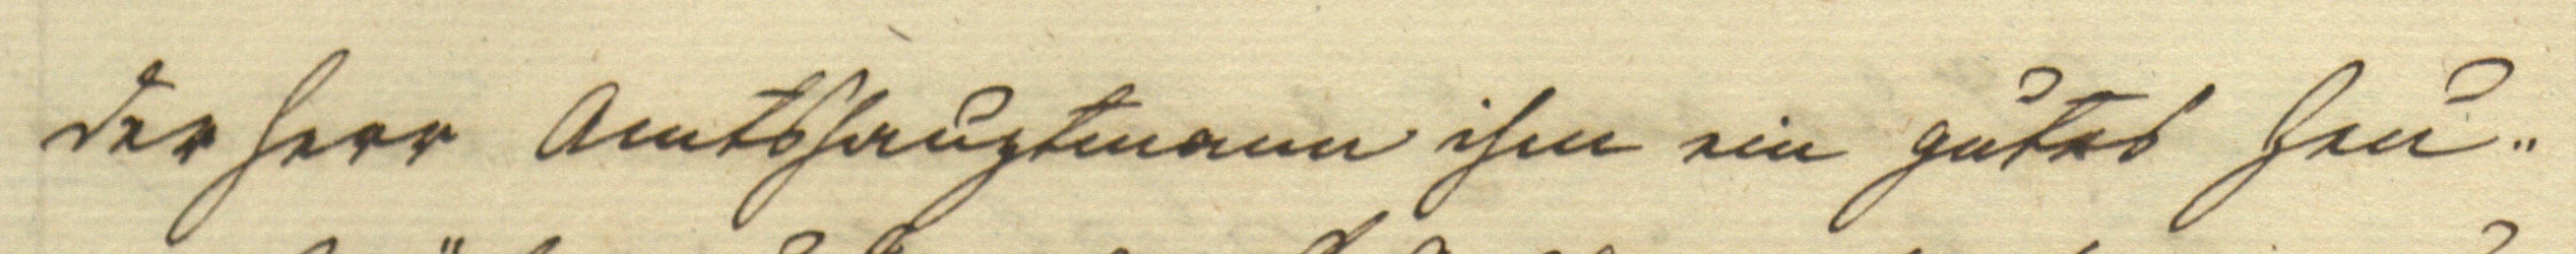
der Herr Amtshauptmann ihm ein gutes Zeu¬
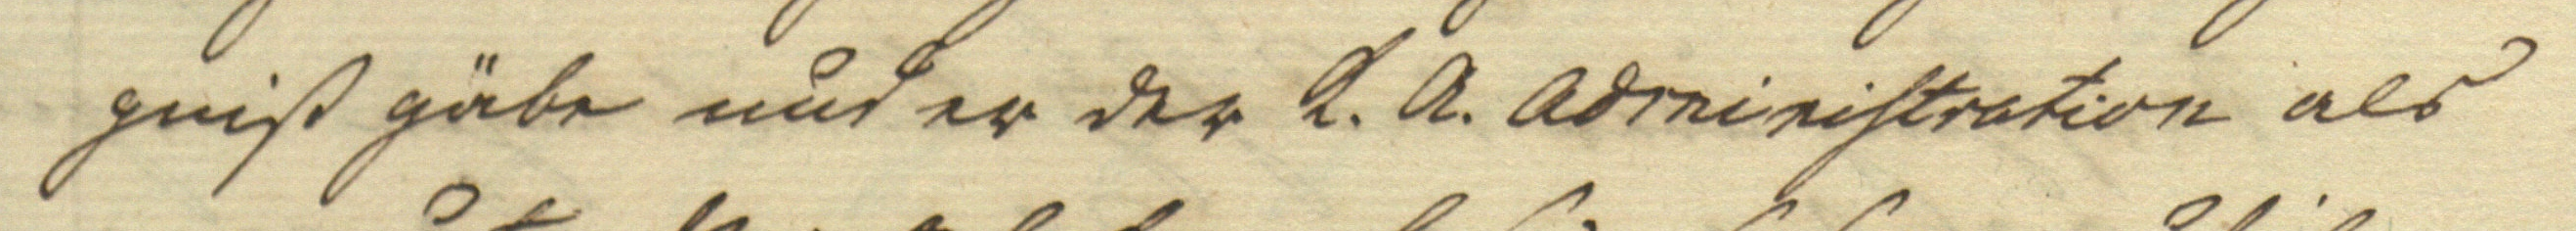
gniß gäbe und er der K. A. Administration als
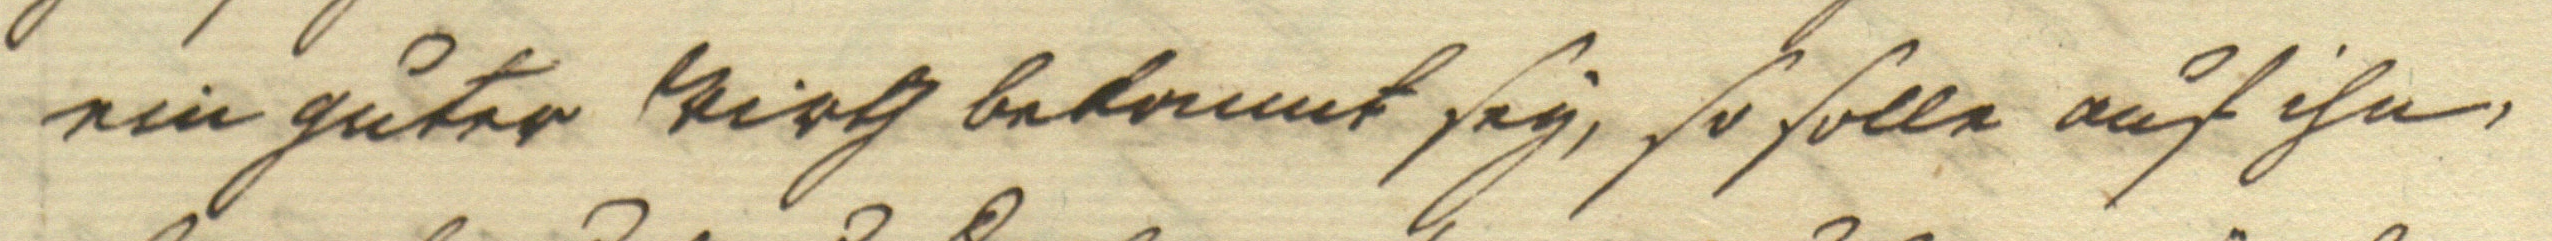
ein guter Wirth bekannt seÿ, so solle auf ihn
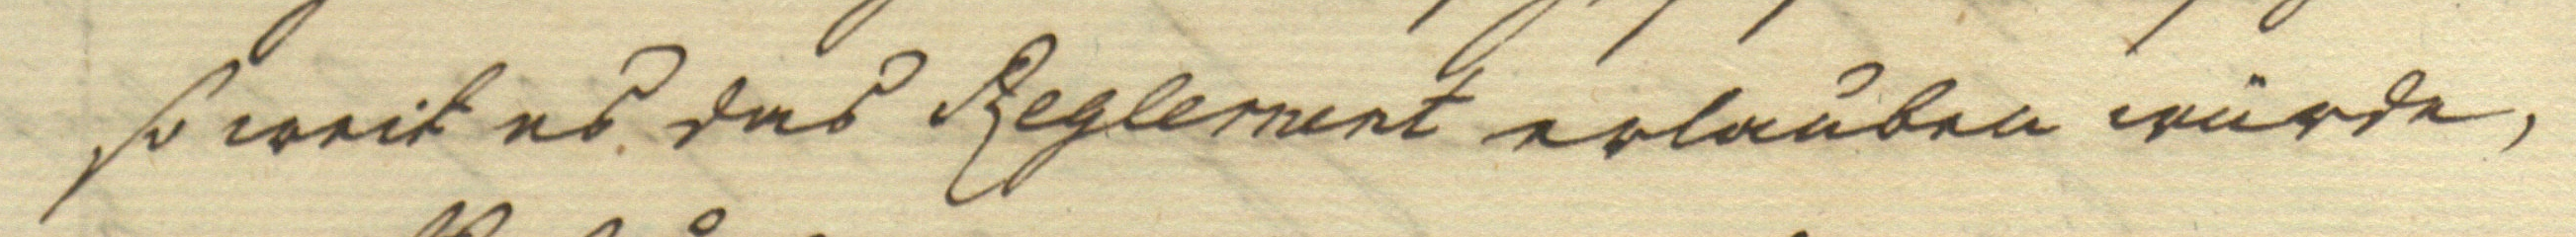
so weit es das Reglement erlauben würde,
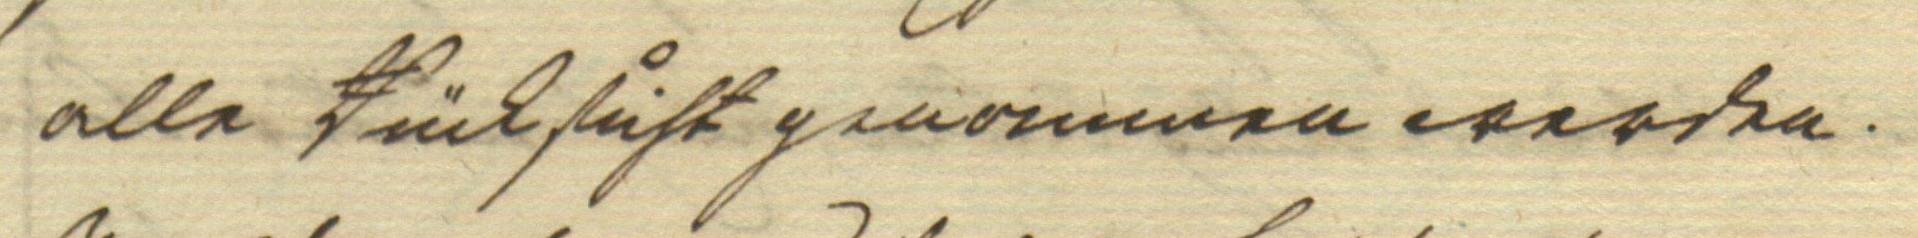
alle Rücksicht genommen werden.
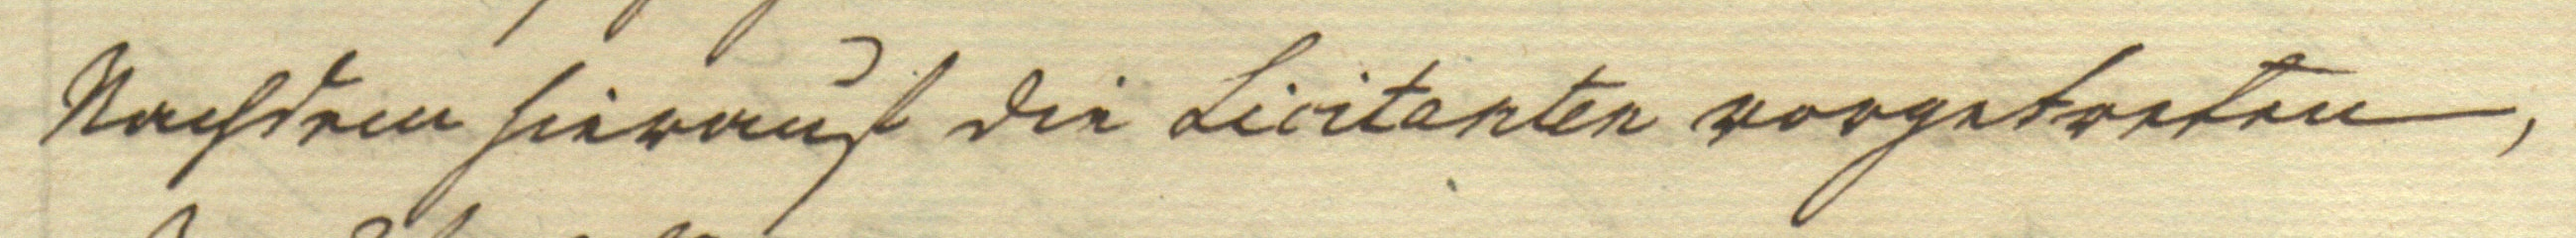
Nachdem hierauf die Licitanten vorgetreten,
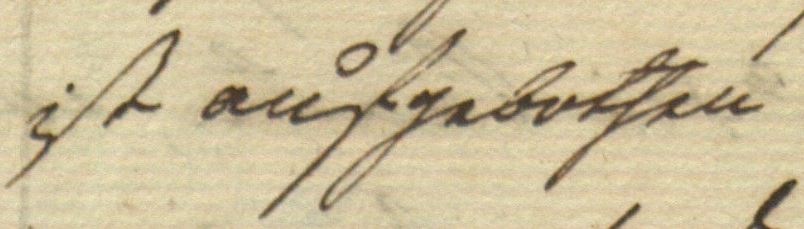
ist aufgebothen
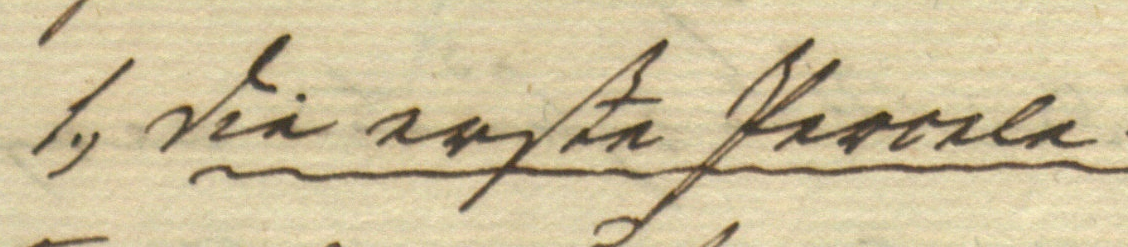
1., die erste Percele.
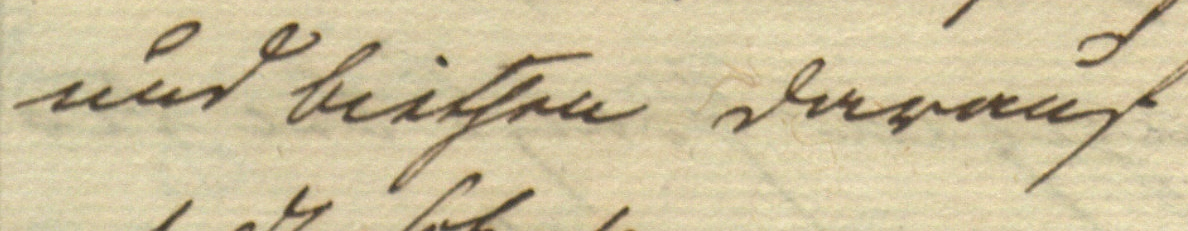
und biethen darauf
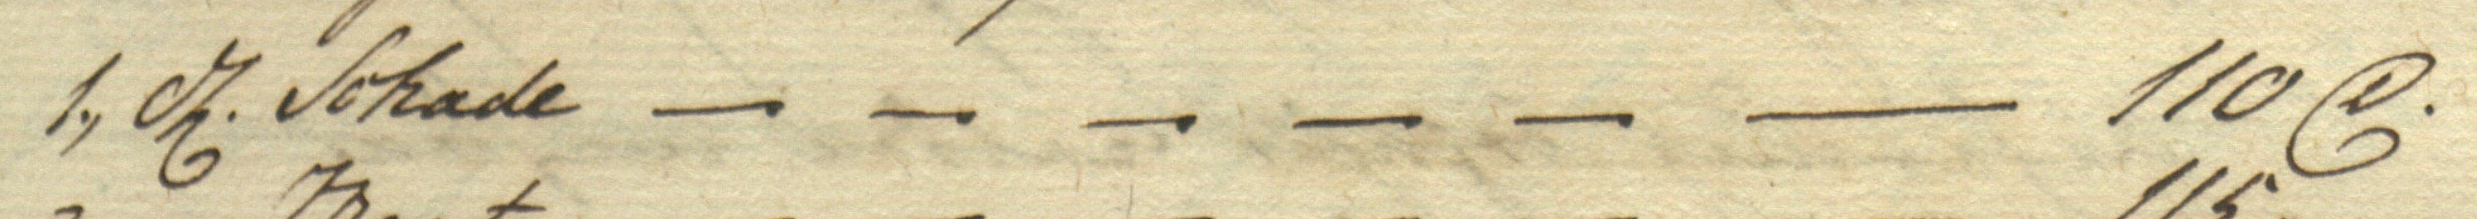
1., dh. Schade 110 l.
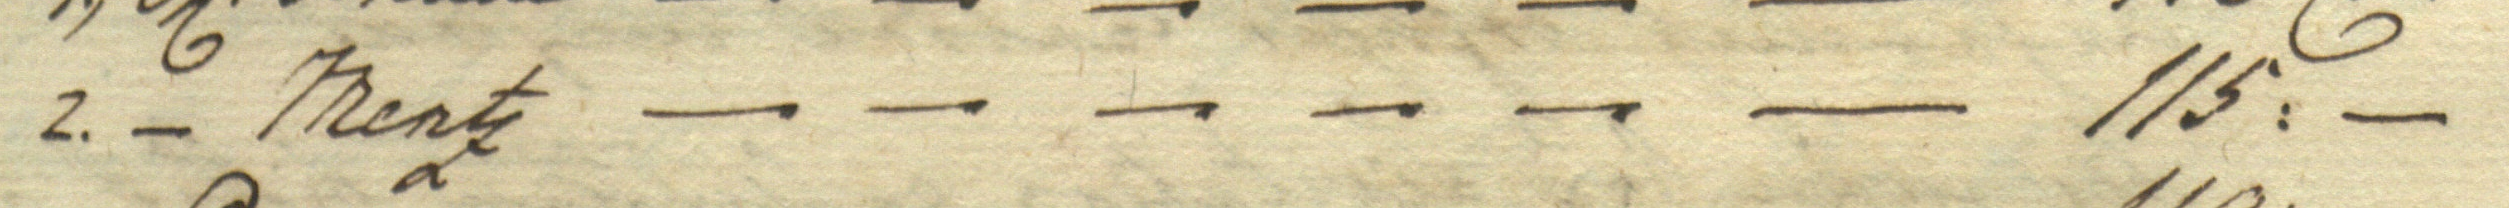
2. Mentz 115:
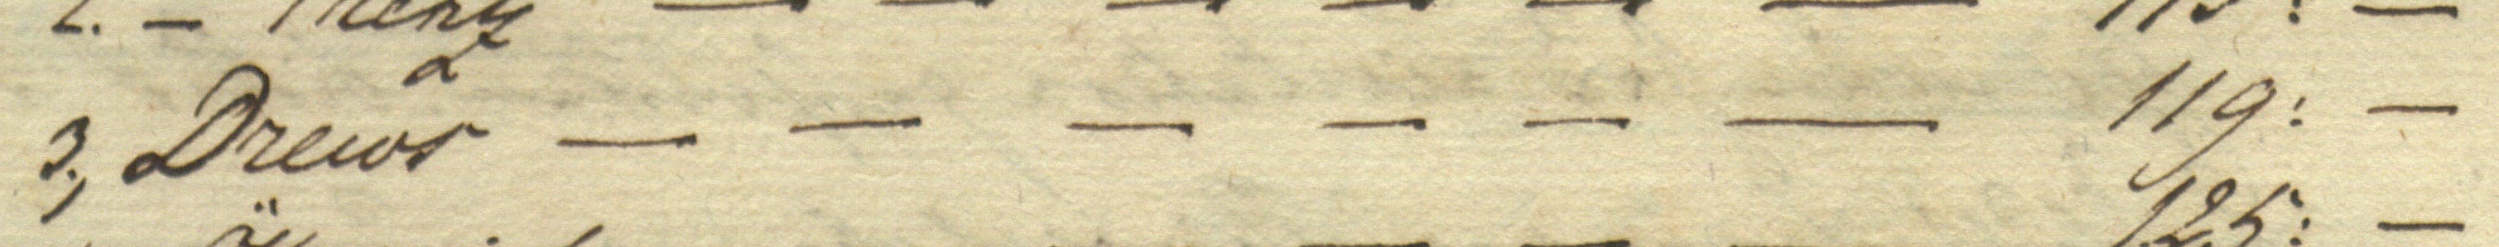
3, Drews 119:
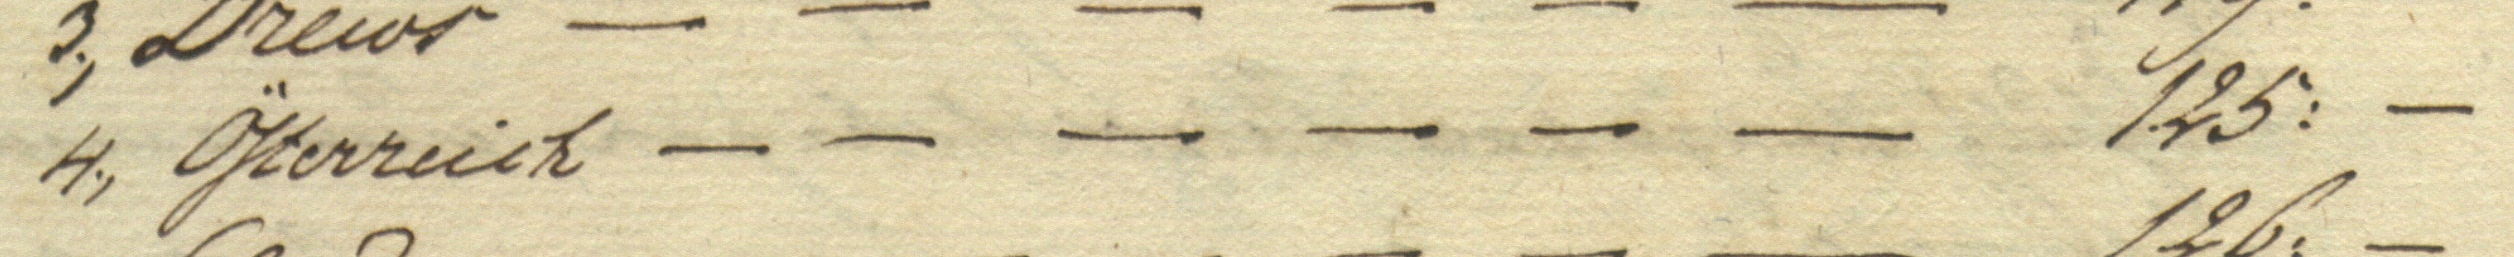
4., Österreich 125:
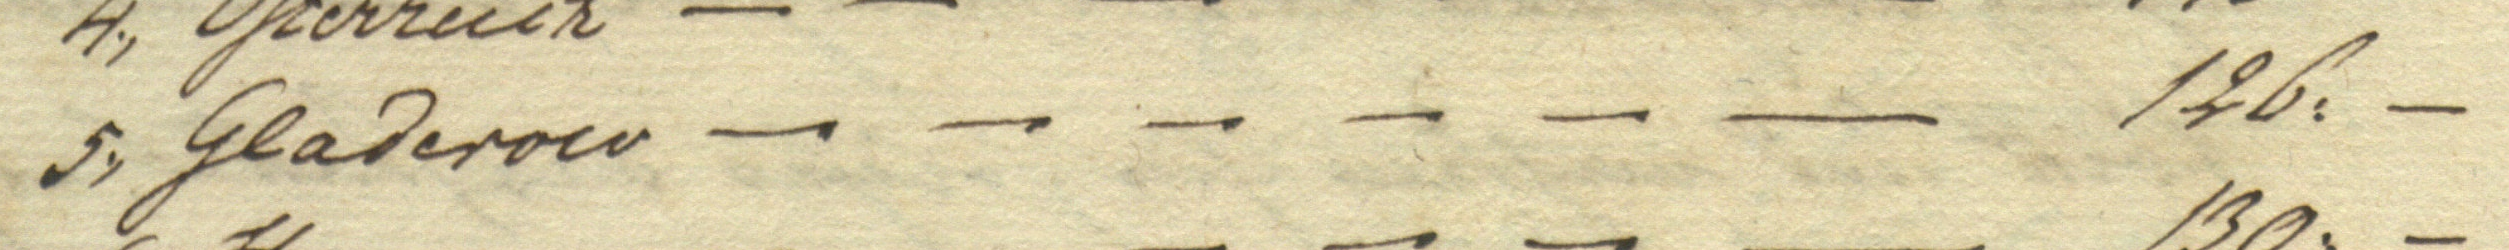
5., Gladerow 126:
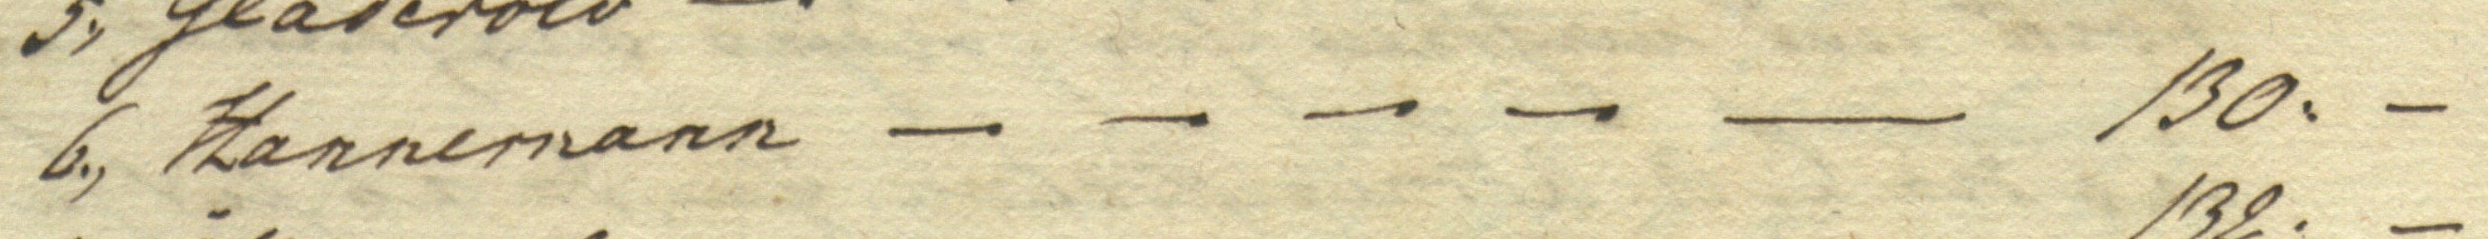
6., Hannemann 130:
